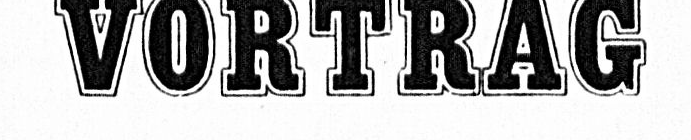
VORTRAG
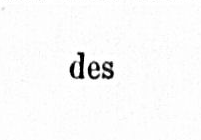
des
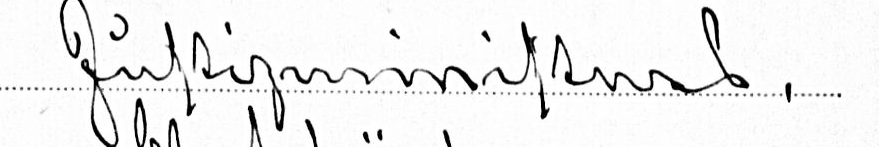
Justizministers
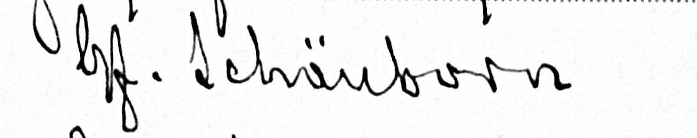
xx Schönborn
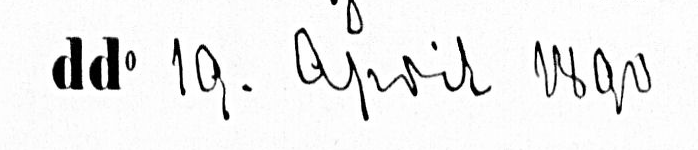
dd° 19. April 1890
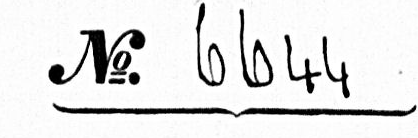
N° 6644
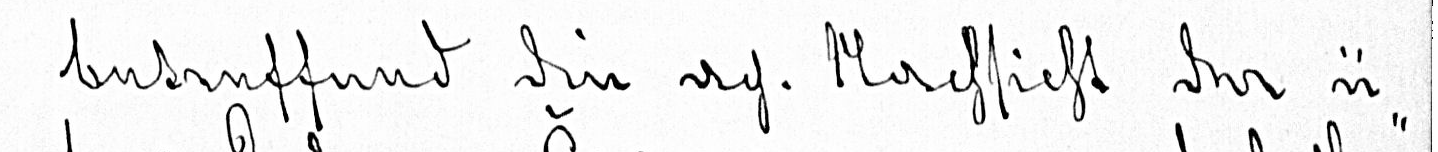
betreffend die ag. Nachsicht der ü¬
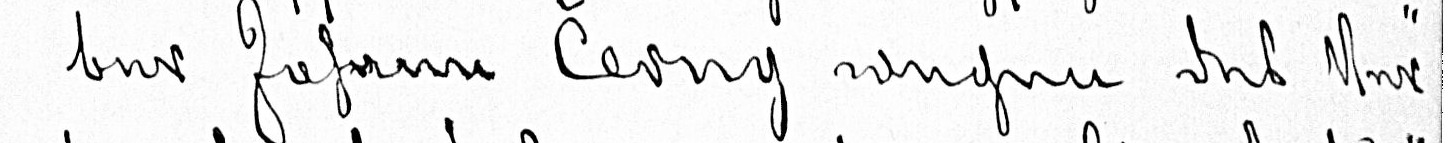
ber Johann Černy wegen des Ver¬
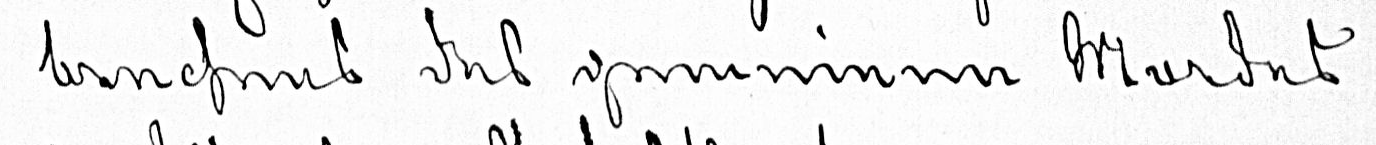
brechens des gemeinen Mordes
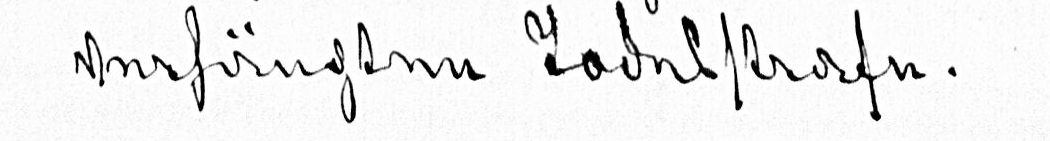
verhängten Todesstrafe.
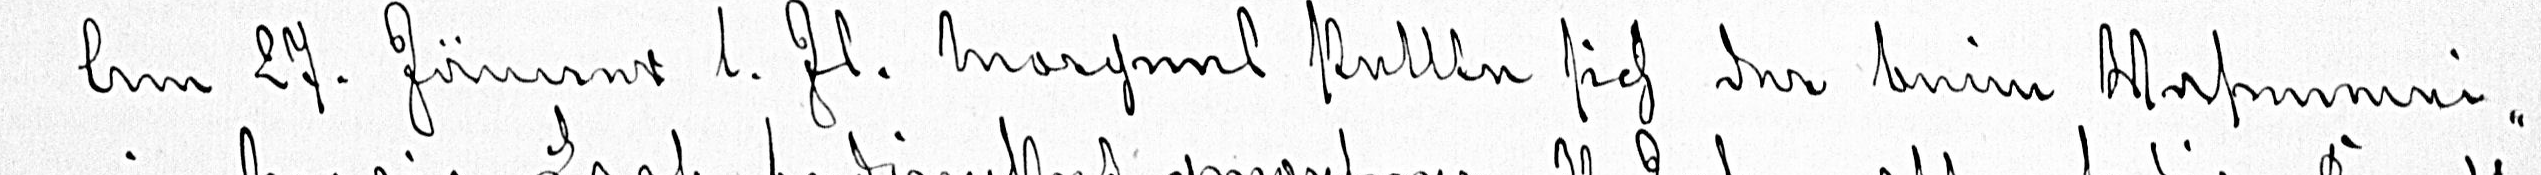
Am 27. Jänner. 1. Js. Morgens stellte sich der beim Wasenmei¬
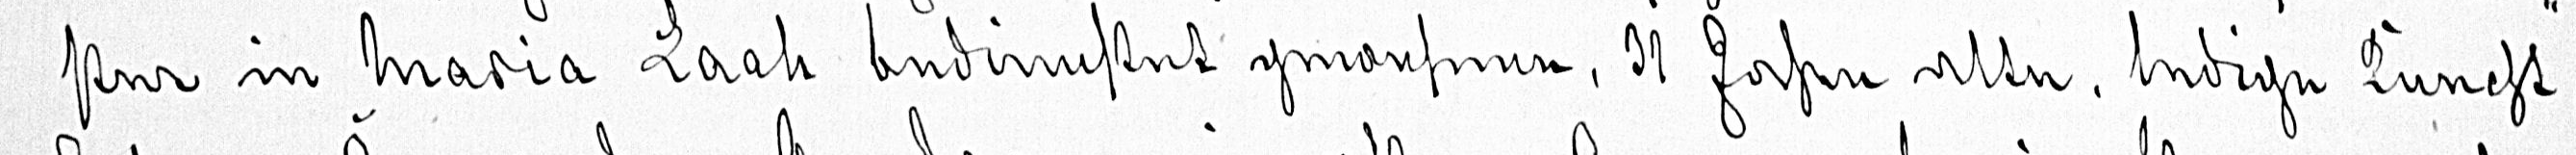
ster in Maria Laah bedienstet gewesnen, 31 Jahre alte, ledige Knecht
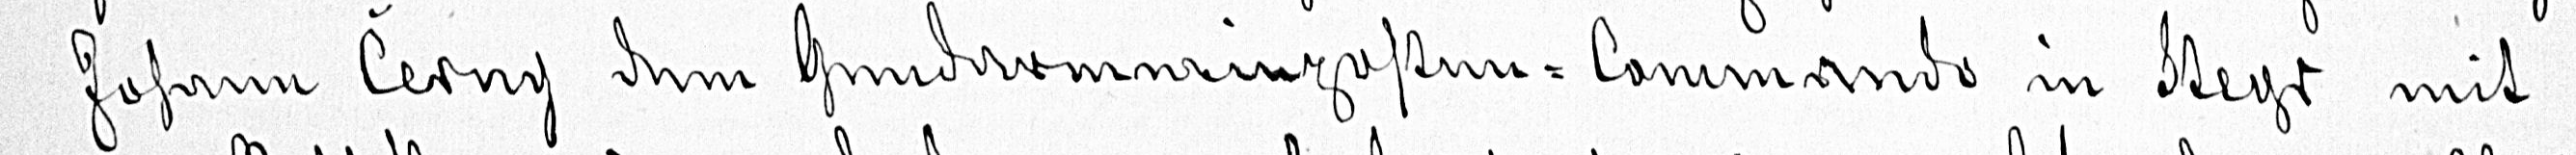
Johann Černy dem Gendarmerieposten - Commando in Steyr mit
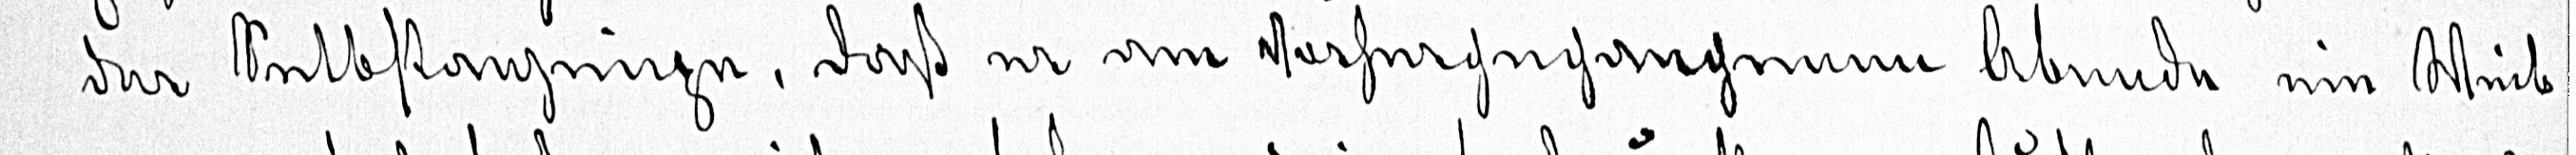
der Selbstanzeige, daß er am vorhergegangenen Abende ein Weib¬
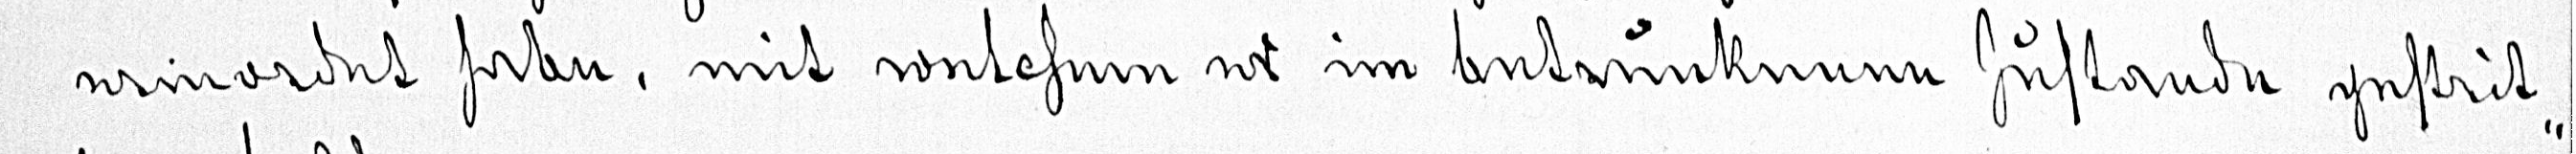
xxeinordet habe, mit welchem er in betrunkenen Zustande gestrit¬
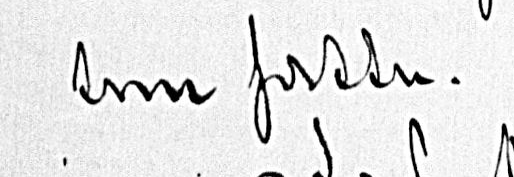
ten halle.
